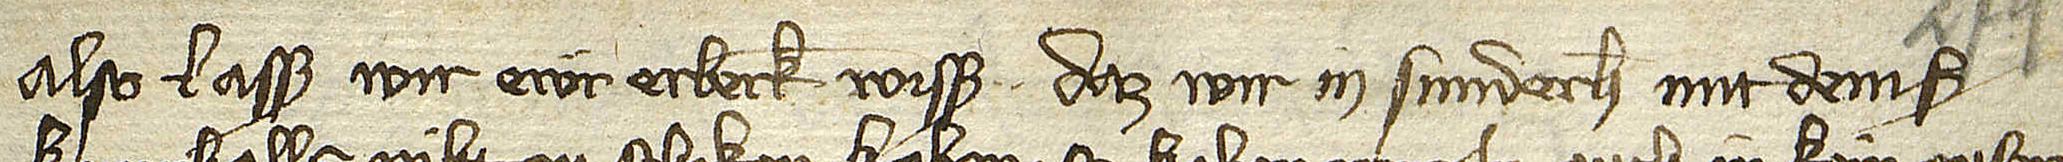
alſo laſſ* wir eẅr erberk* wiſſ* daʒ wir in ſunderh* mit demſ*
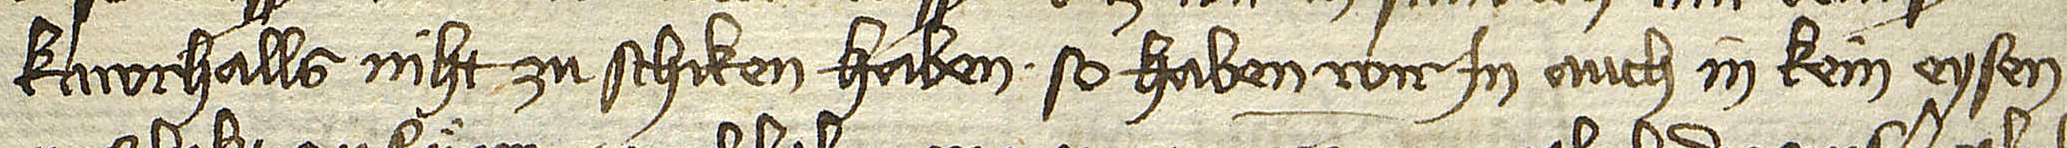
kawrhalls niht ʒu ſchiken haben . ſo haben wir In auch in kein eyſen
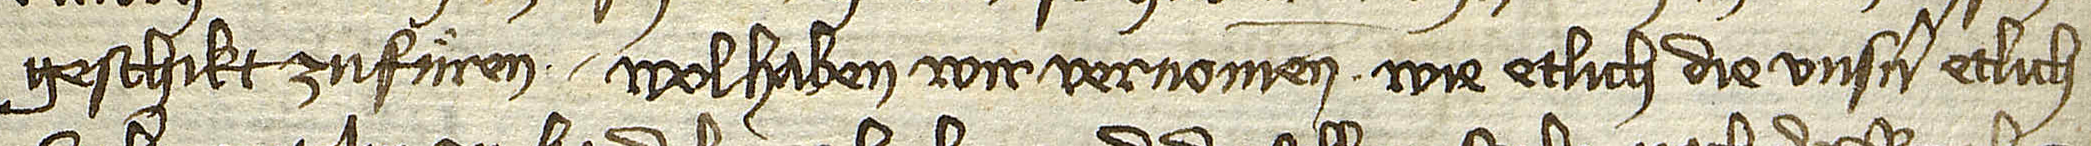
geſchikt ʒu füren / wol haben wir vernomen . wie etlich die vnſ*n etlich
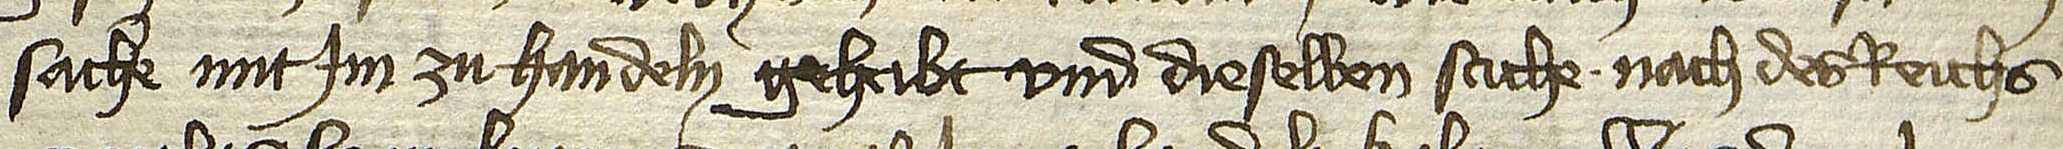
ſache* mit Im ʒu handeln gehabt vnd die ſelben ſache . nach des Reichs
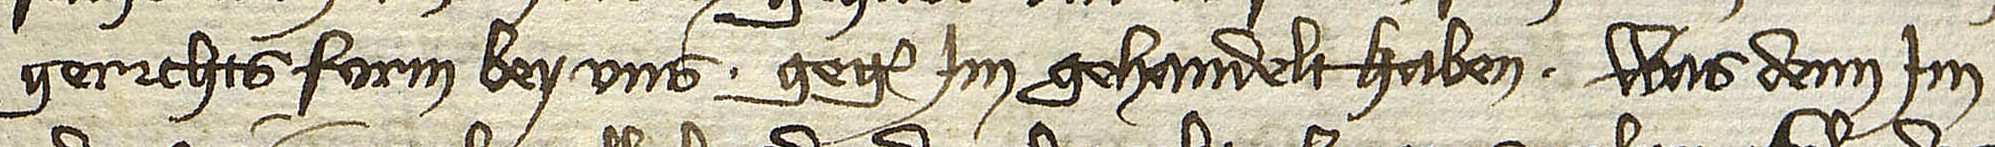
gerichts form bey vns . geg* Im gehandelt haben . Was denn Im
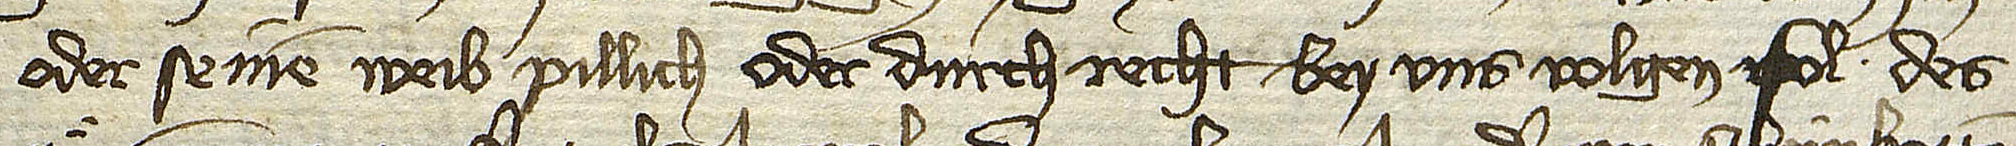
oder ſeine* weib pillich oder durch recht bey vns volgen ſol . des
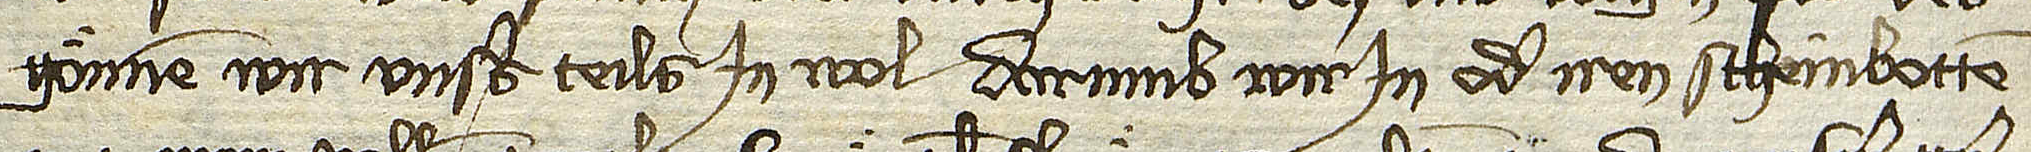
gönne* wir vnſ*s teils In wol* daru*b wir In od* iren ſcheinbotte*
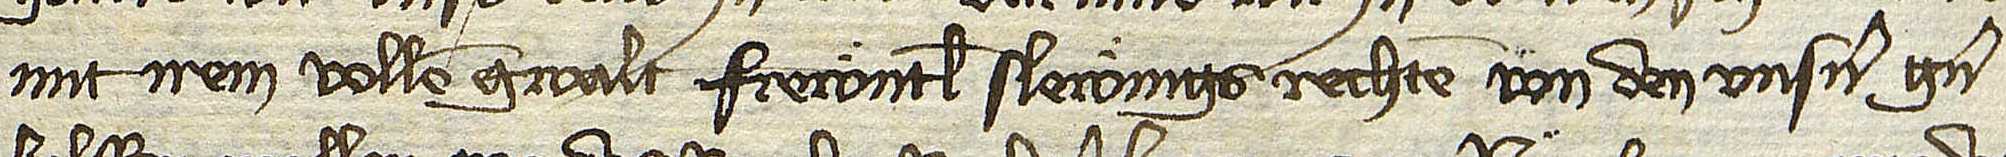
mit irem volle* gwalt freẅntl* ſlewnigs rechte* von den vnſ*n g*n
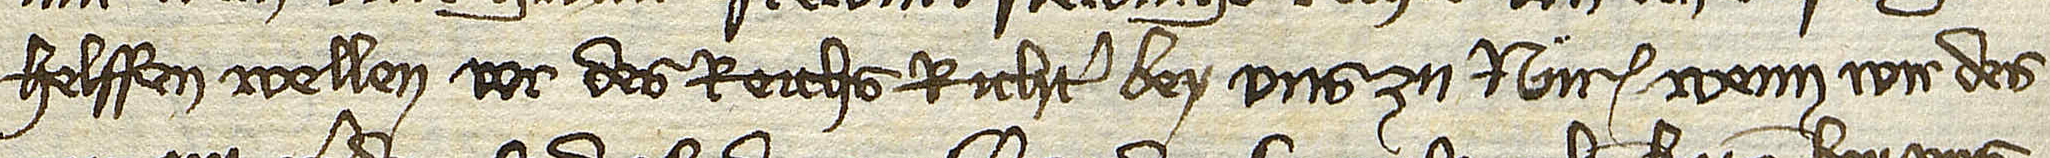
helffen wellen vor des Reichs Richt* bey vns ʒu Nür* wenn wir des
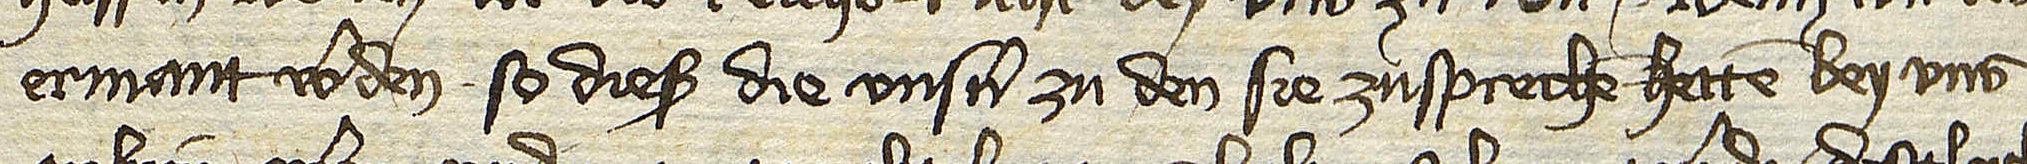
ermant w*den . ſo dieſ* die vnſ*n ʒu den ſie ʒuſpreche* hette* bey vns
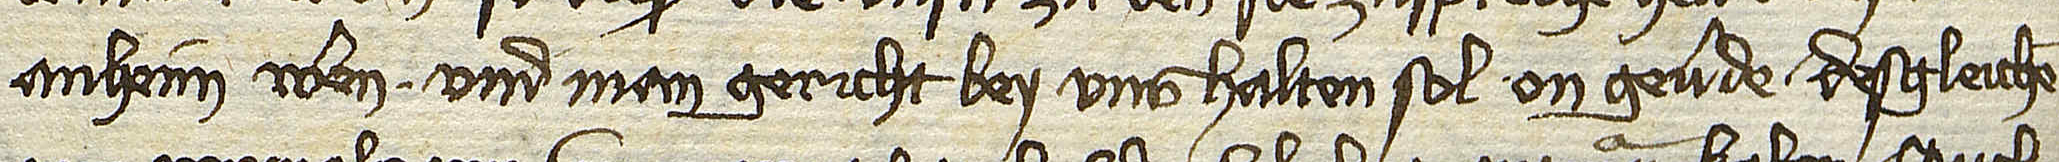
anheim w*en . vnd man gericht bey vns halten ſol . on geu*de / deſgleiche*
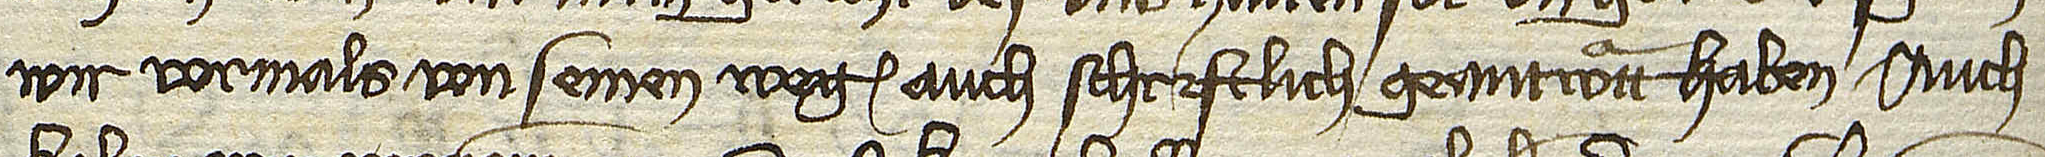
wir vormals von ſeinen weg* auch ſchriftlich geantw*tt haben / Auch
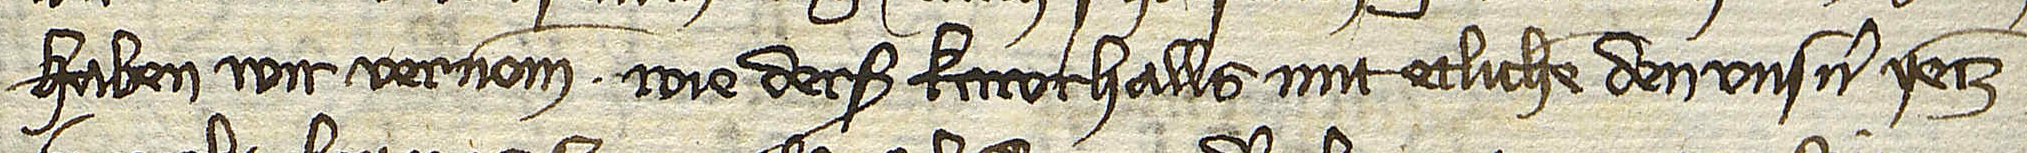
haben wir vernom* . wie derſ* kawrhalls mit etliche* den vnſ*n yecʒ*
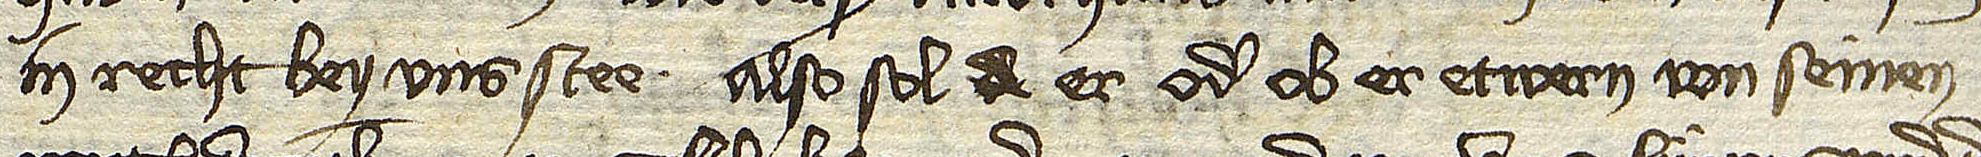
in recht bey vns ſtee . alſo ſol d er od* ob er etwern von ſeinen
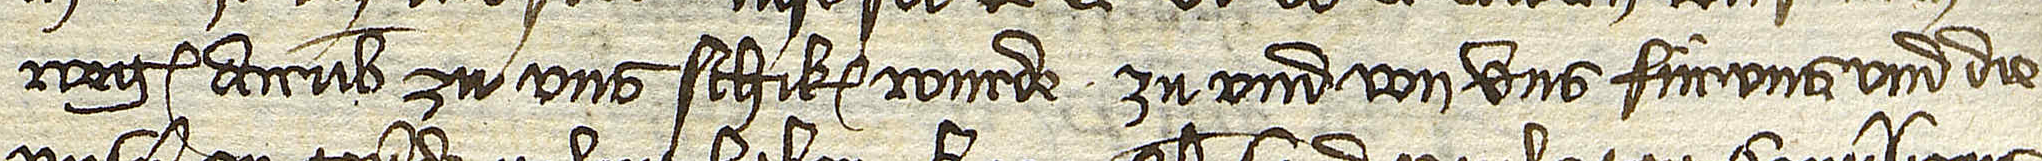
weg* darub* ʒu vns ſchik* wurde . ʒu vnd von Vns für vns vnd die
